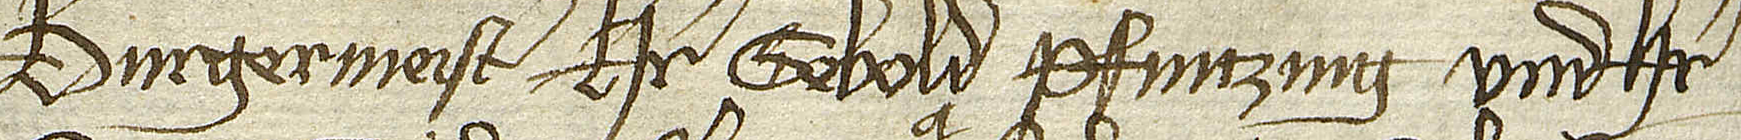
Burgermeiſt* Hr* Sebold pfincʒing vnd Hr*
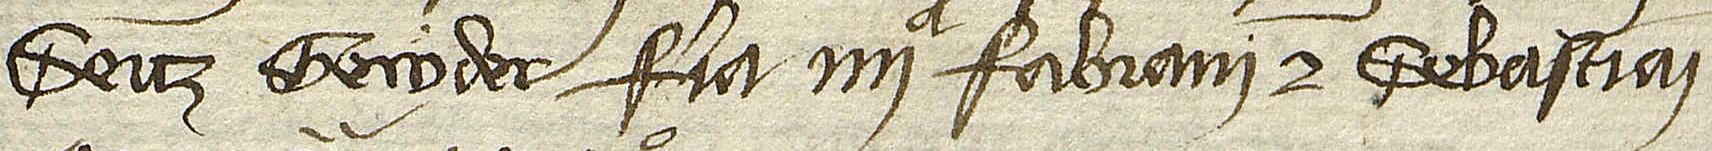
Seicʒ Gewder f*ia iiii* fabiani @ Sebaſtiani
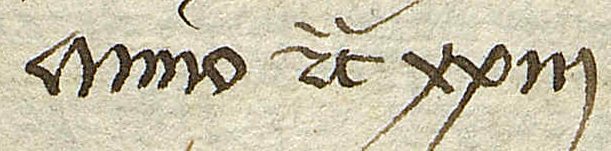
Anno ec* xxiii*
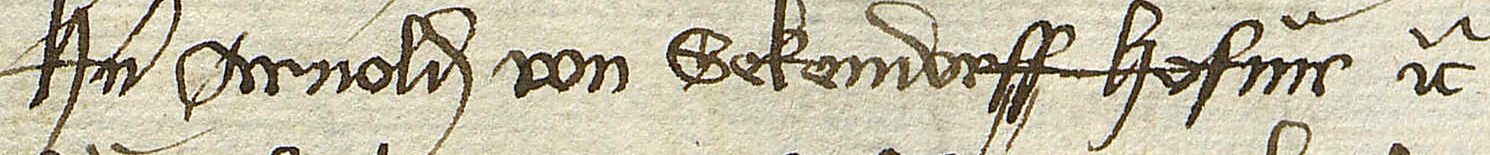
Hn* Arnold* von Sekendorff hofm*r ec*
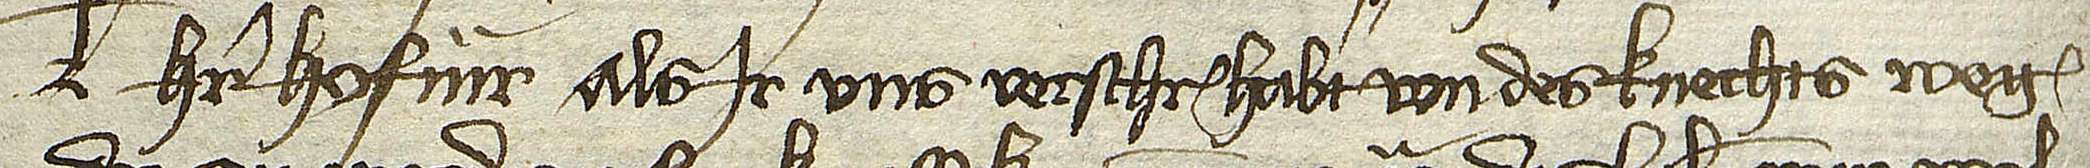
L* h*r hofm*r als Ir vns verſchr* habt von des knechts weg*
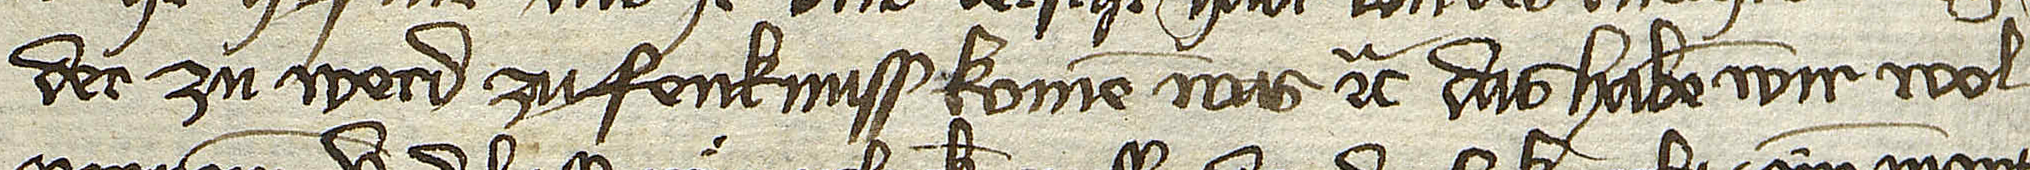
der ʒu werd ʒu fenknuſſ kome* was ec* das habe* wir wol
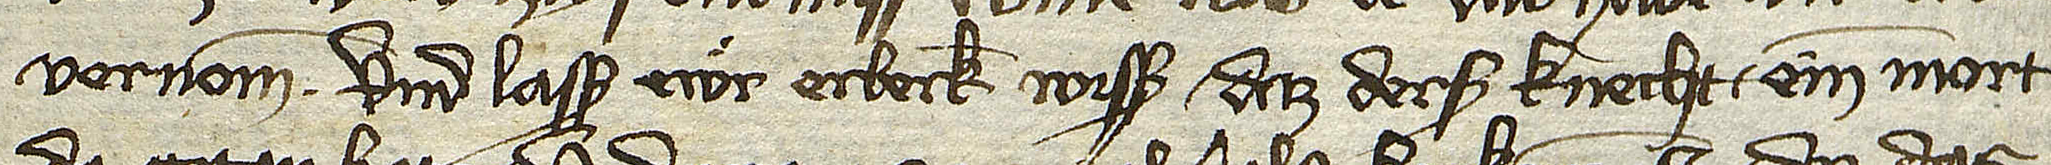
vernom* . Vnd laſſ* eẅr erberk* wiſſ* / daʒ derſ* knecht / ein* mort
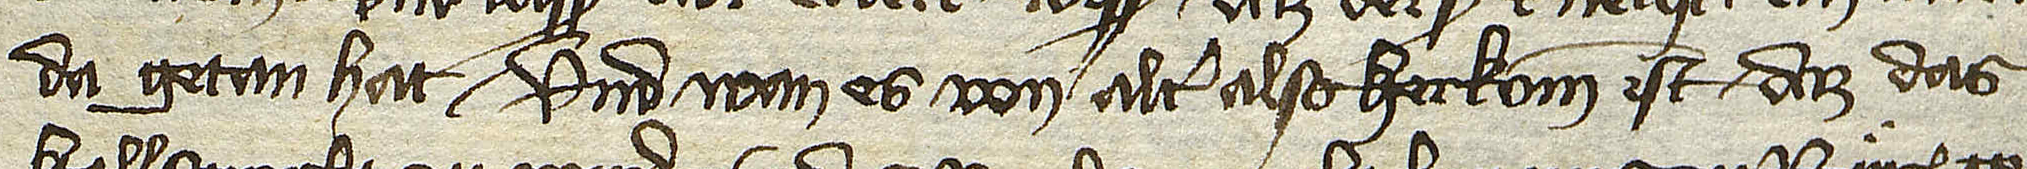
da getan hat / Vnd wan es von alt* alſo herkom* iſt / daʒ das
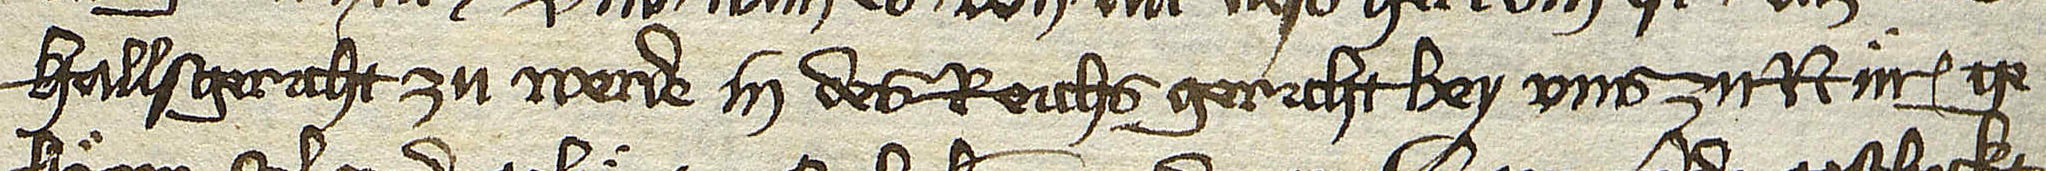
hallſgericht ʒu werde in des Reichs gericht bey vns ʒu Nür* ge =
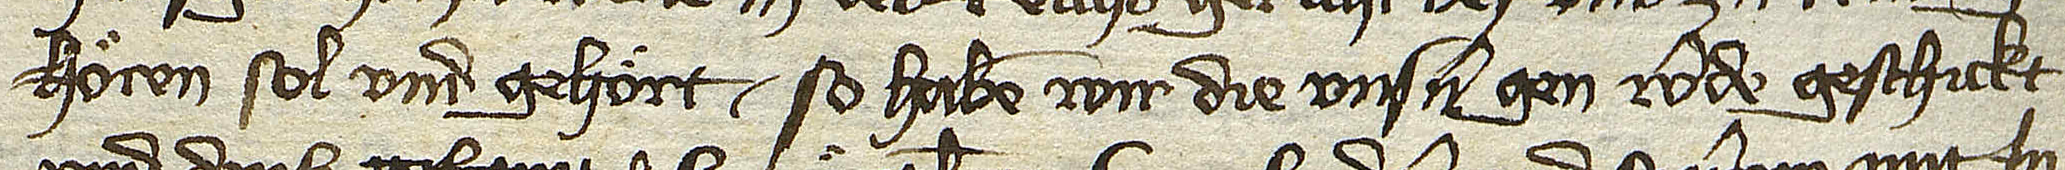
hören ſol vnd gehört / ſo habe* wir die vnſ*n gen w*d geſchickt
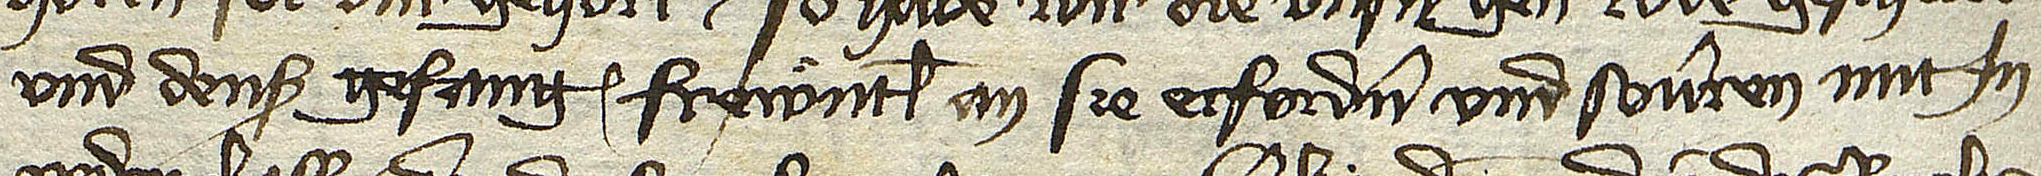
vnd denſ* gefang* freẅntl* an ſie erford*n vnd ſou*ren mit In
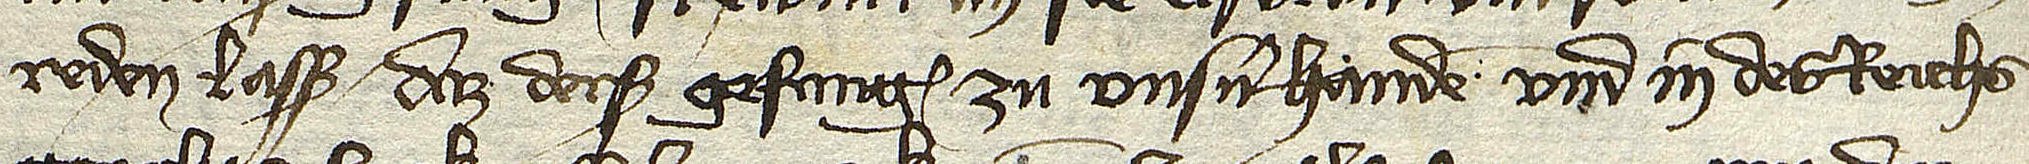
reden laſſ* / daʒ derſ* gefang* ʒu vnſ*n hande* . vnd in des Reichs
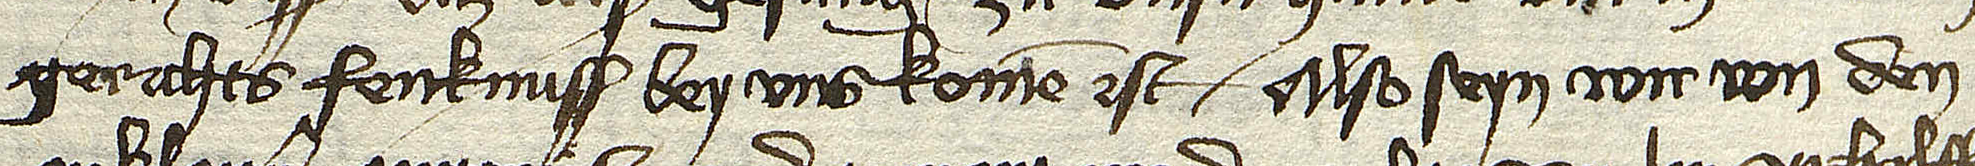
gerichts fenknuſſ bey vns kome* iſt / alſo ſeyn wir von den
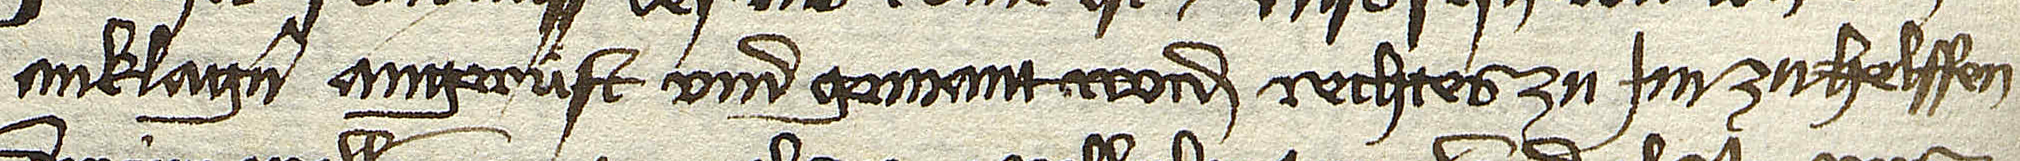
anklag*n angerüft vnd gemant word* rechtes ʒu Im ʒu helffen
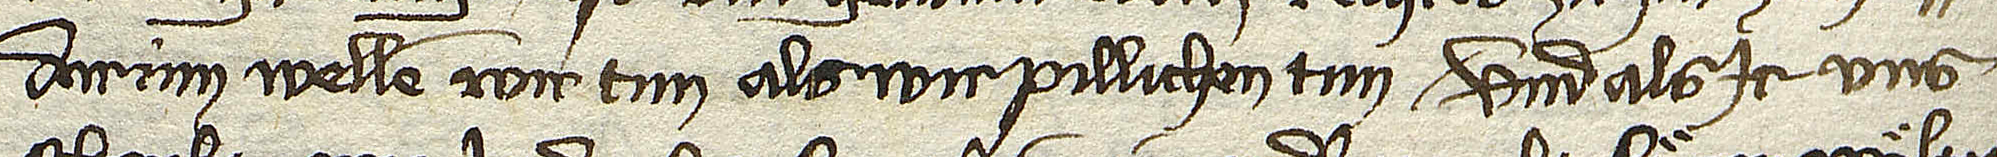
darinn welle* wir tun als wir pillichen tun / Vnd als Ir vns
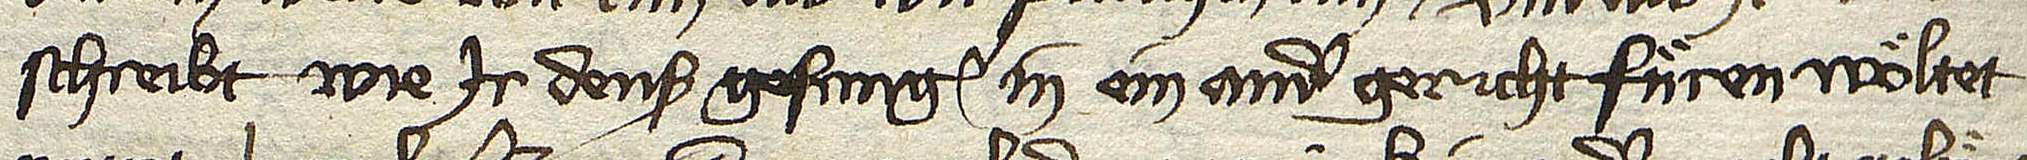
ſchreibt wie Ir denſ* gefang* in ein and* gericht füren wöltet
